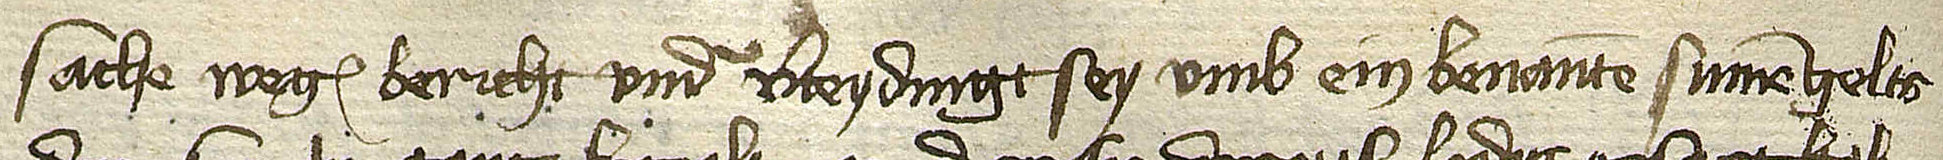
ſache weg* bericht vnd v*teydingt ſey vmb ein benan*te ſum*e gelts
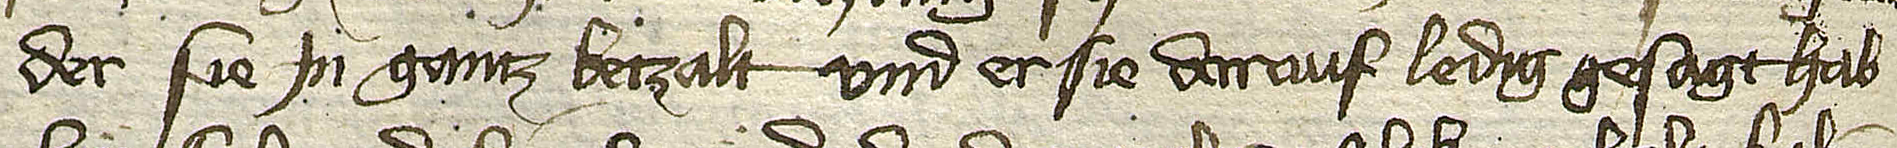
der ſie In gancʒ becʒalt vnd er ſie darauf ledig geſagt hab
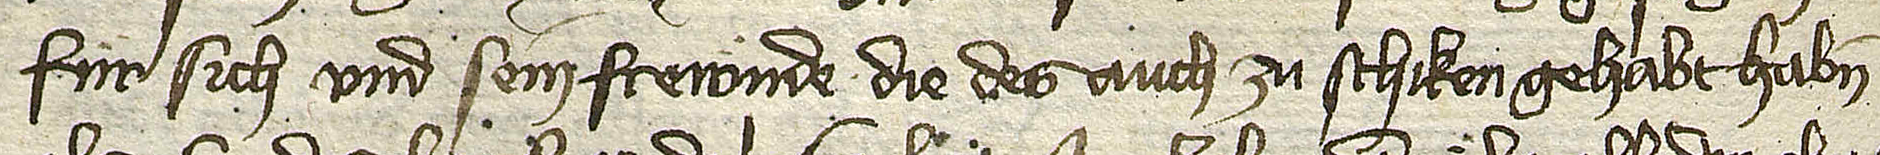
für ſich vnd ſein freẅnde die des auch ʒu ſchiken gehabt habn*
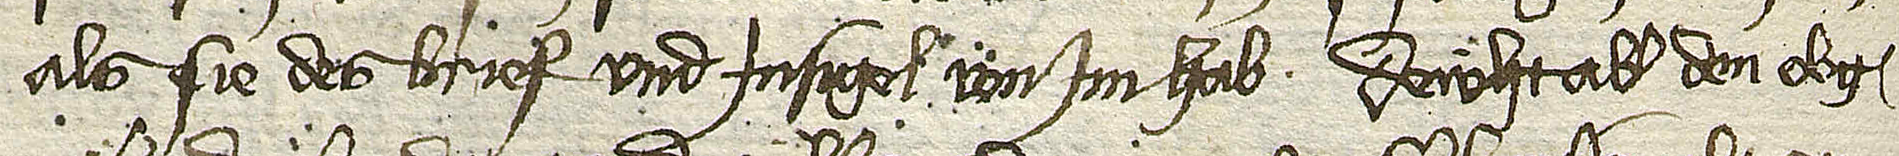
als ſie des brief vnd Inſigel von Im hab . Deẅht ab* den obg*
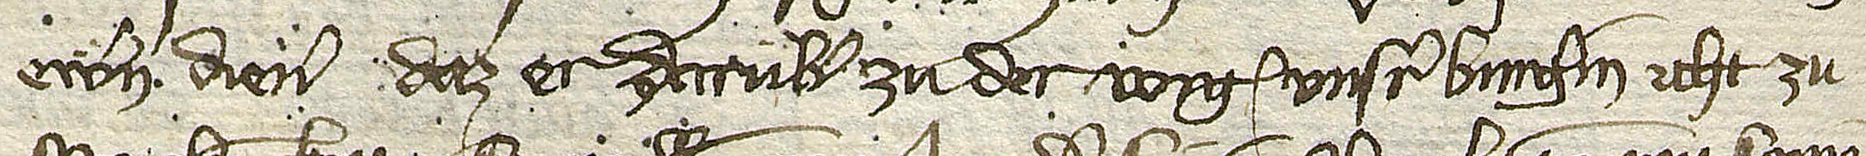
eẅ*n dien* daʒ er darüb* ʒu der vorg* vnſr* burg*in icht ʒu
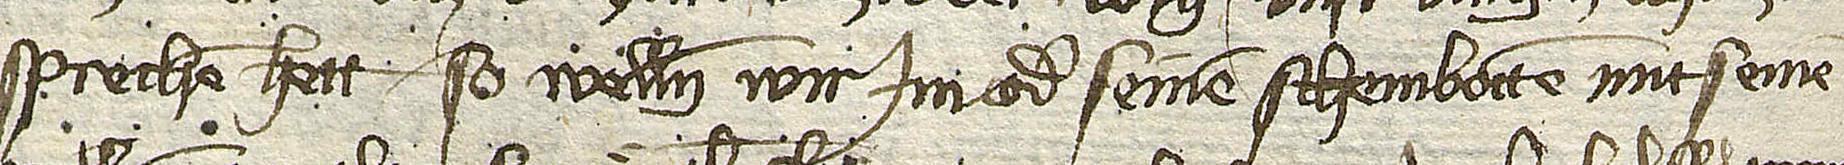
ſpreche* hett / ſo welln* wir Im od* ſeine* ſcheinbotte* mit ſeine*
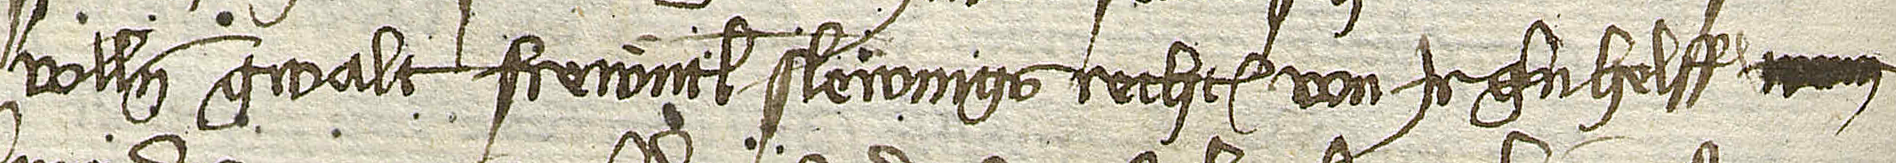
volln* gwalt freẅntl* ſlewnigs recht* von Ir g*n helff* wenn
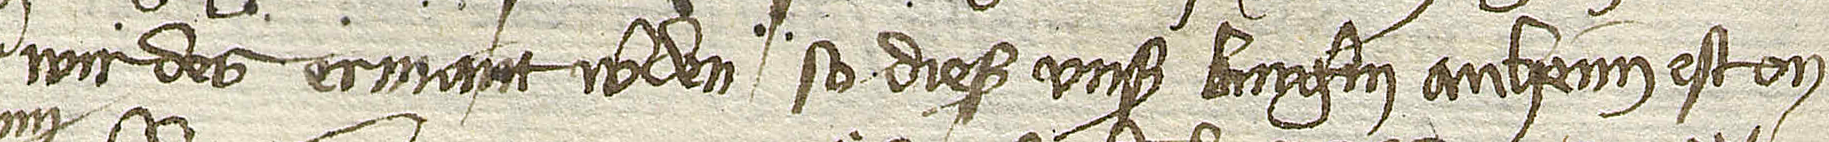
wir des ermant w*den ſo dieſ* vnſ* burg*in anheim iſt on
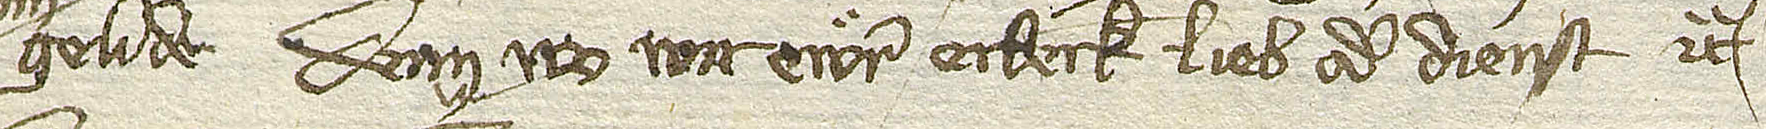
geu*de Denn wo wir eẅr* erberk* lieb od* dienſt ec*
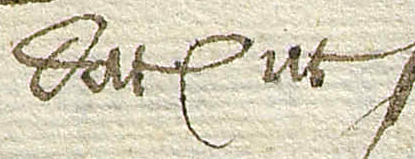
Dat* ut ſ*
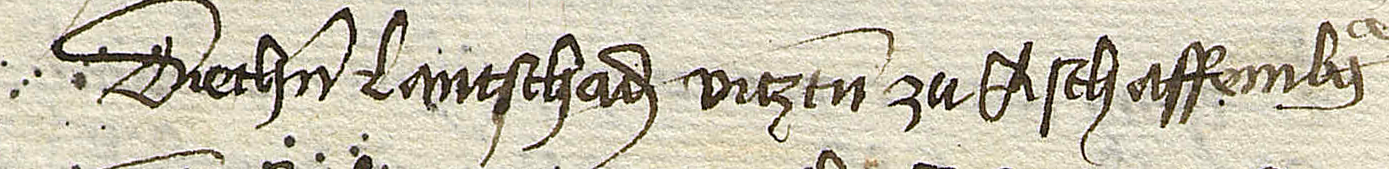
Diethn* lantſchad* vicʒtu* ʒu Aſchaffemb*g
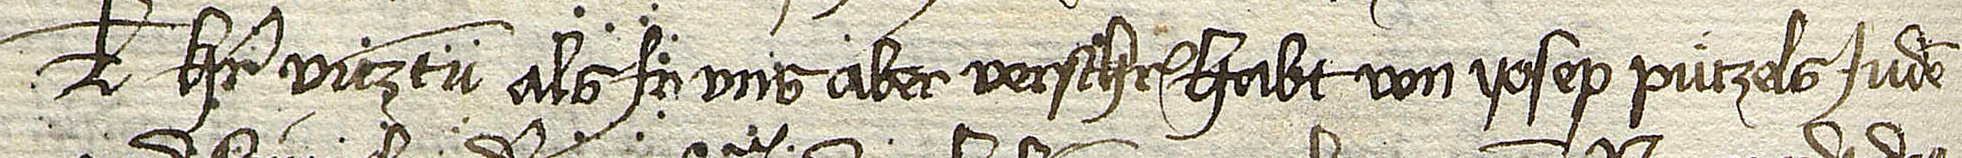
L* Hr* vicʒtu* als Ir vns aber verſchr* habt von Yoſep pücʒels Iude*
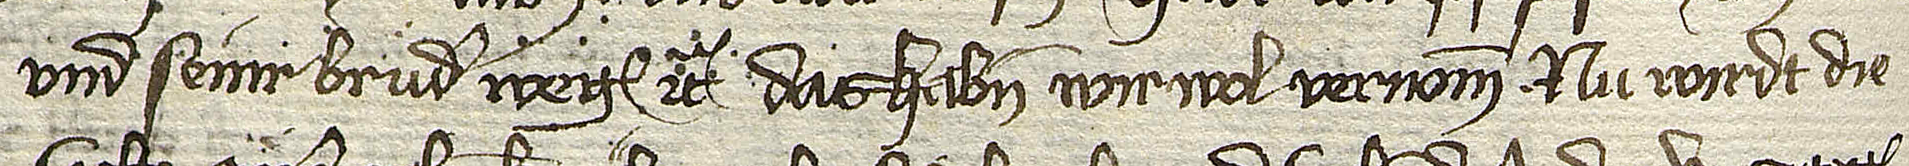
vnd ſeinr brud* weg* ec* das habn* wir wol vernom* . Nu wirdt die
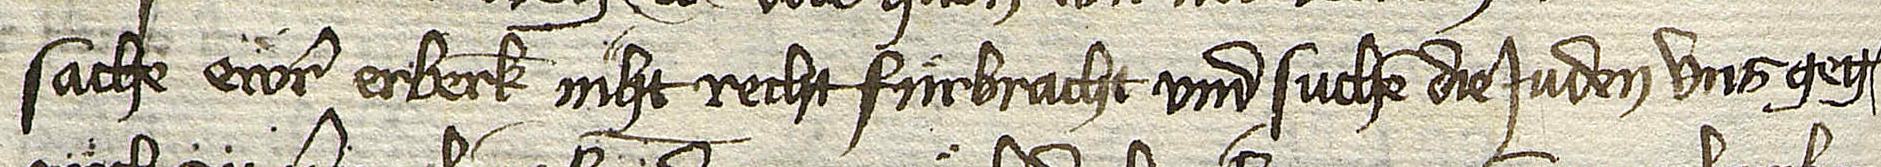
ſache eẅr* erberk* niht recht fürbracht vnd ſuche* die Iuden vns geg*
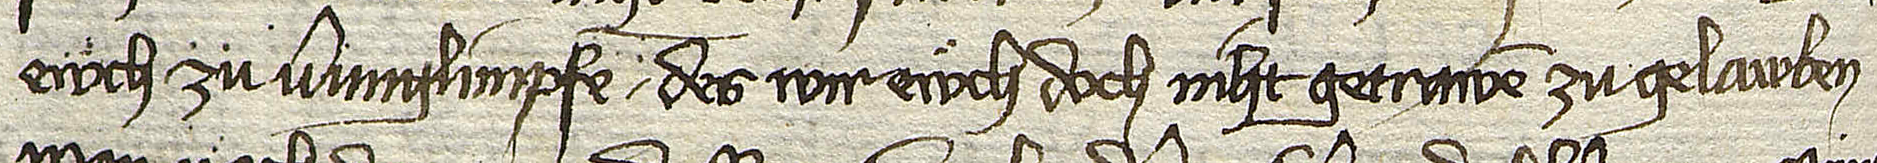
eẅch ʒu u*unglimpfe* / des wir eẅch doch niht getrawe* ʒu gelawben
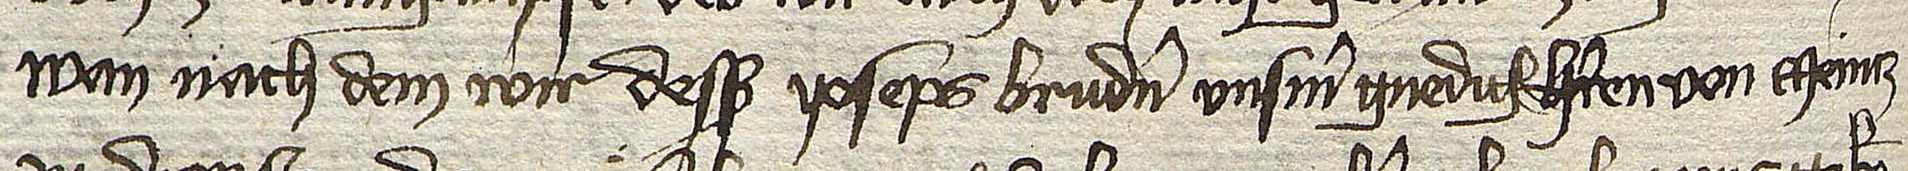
wan nach dem wir deſſ* Yoſeps brudn* vnſm* gnedig* h*ren von Meincʒ
